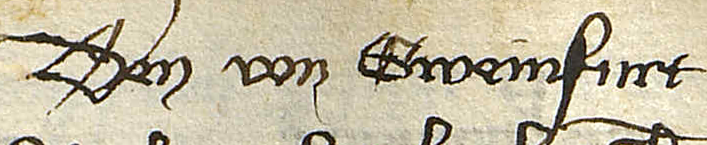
Den von Sweinfurt
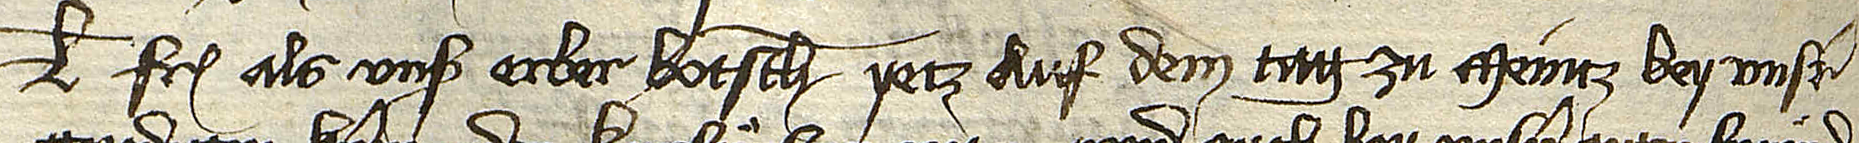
L* fr* als vnſ* erber botſch* yecʒ auf dem tag ʒu Meincʒ bey vnſr*
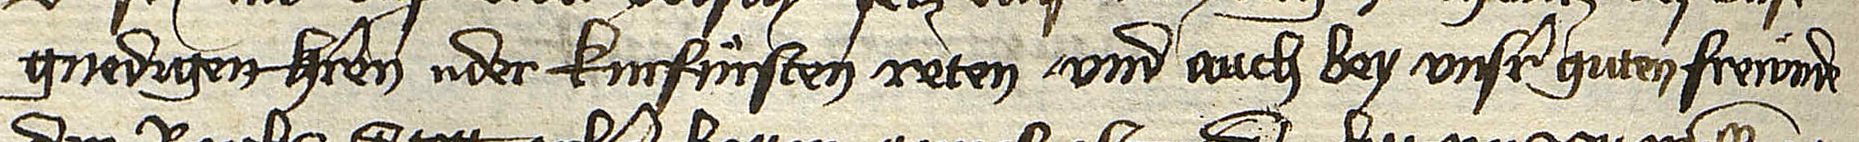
gnedigen hr*en ~ der kurfürſten reten / vnd auch bey vnſr* guten frewnde
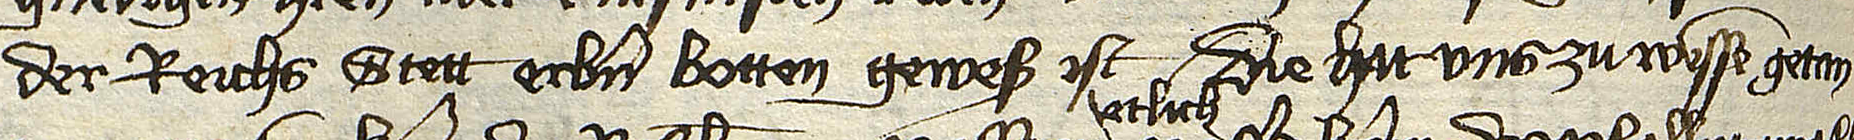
der Reichs Stett erbn* botten geweſ* iſt / Die hat vns ʒu wiſſe* getan
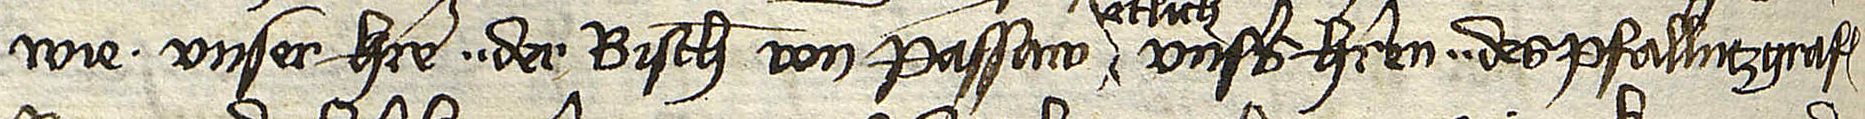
wie . vnſer hre* ~ der Biſch* von Paſſaw vnſ*s hr*en ~ des Pfallncʒgraf*
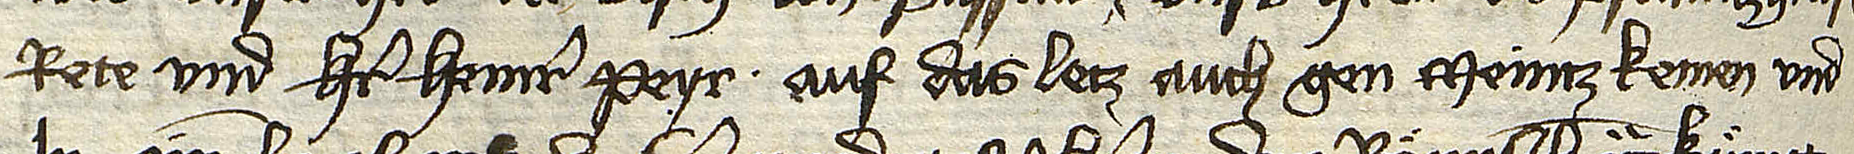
Rete vnd Hr* Heinr* Peyr . auf das lecʒ auch gen Meincʒ kemen vnd
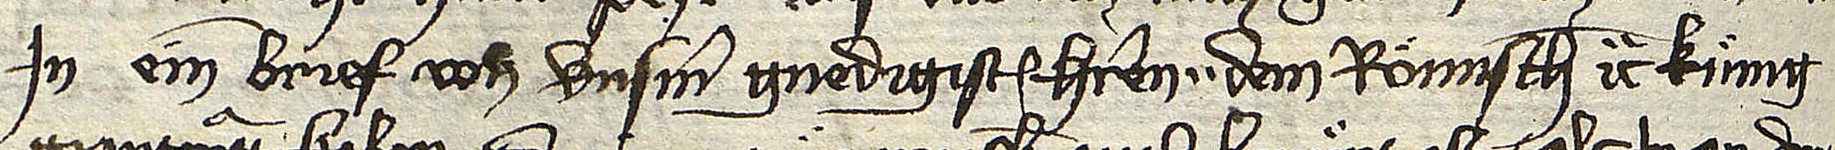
In ein* brief von vnſm* gnedigiſt* Hr*en ~ dem Römiſch* ec* künig
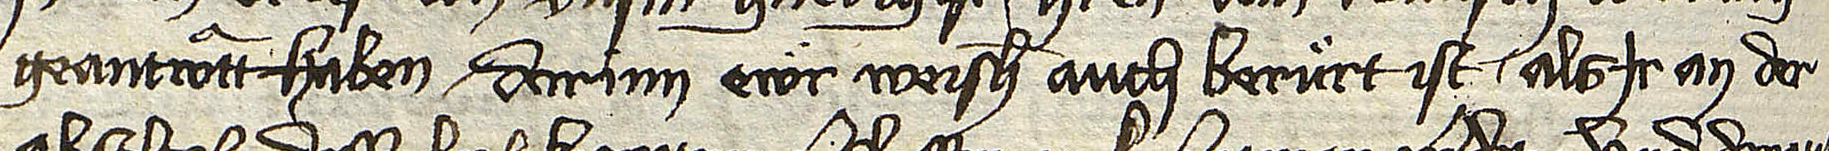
geantw*tt haben / Darinn ewr weiſh* auch berürt iſt / als Ir an der
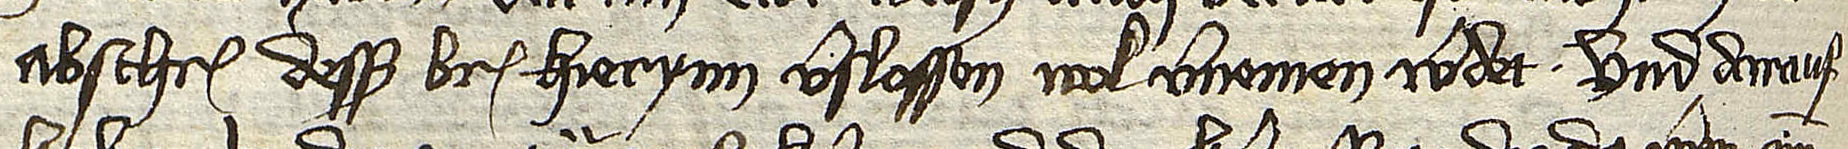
abſchr* deſſ* br* hierynn v*ſloſſen wol v*nemen w*det . Vnd darauf
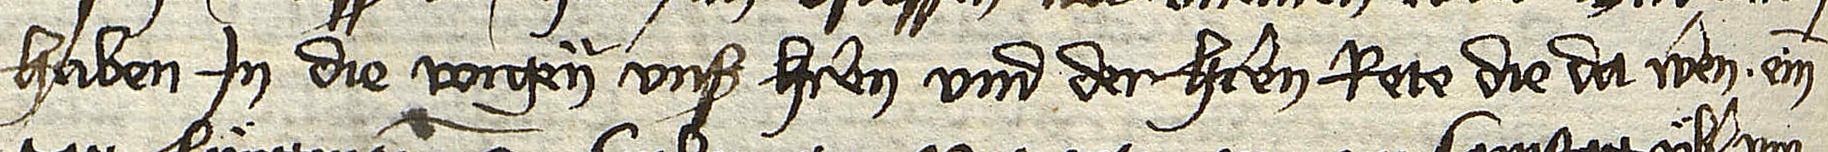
haben In die vorgen* vnſ* hr*en vnd der hr*ren Rete die da w*en . ein*
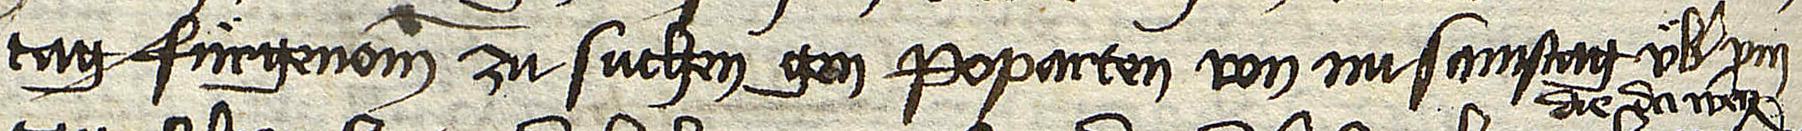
tag fürgenom* ʒu ſuchen gen Poparten von nu ſamſtag v̈b* %%
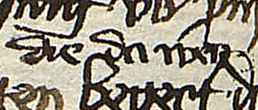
die da w*en
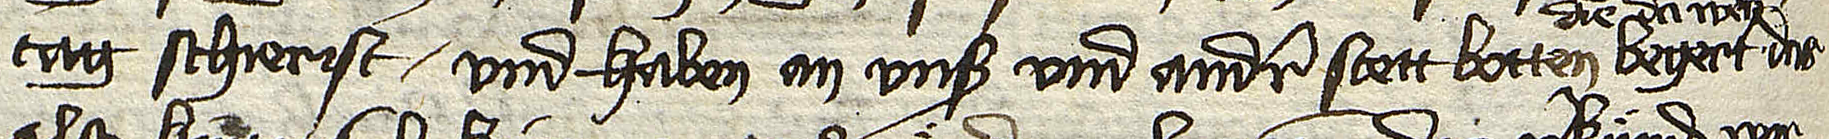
tag ſchieriſt / vnd haben an vnſ* vnd andr* ſtett botten begert das
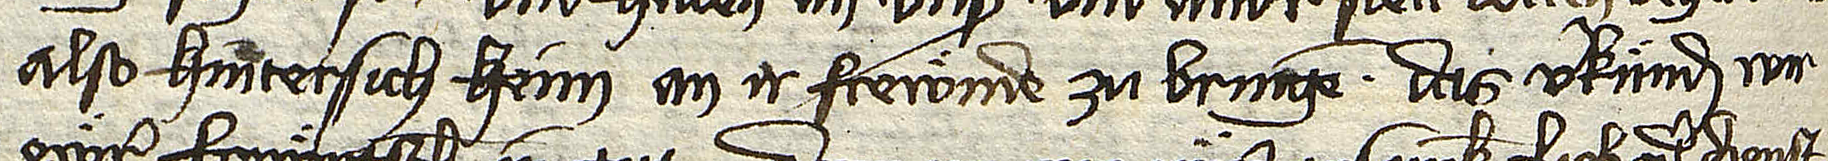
alſo hinterſich Heim an ir frewnde ʒu bringe* . das v*künd* wir
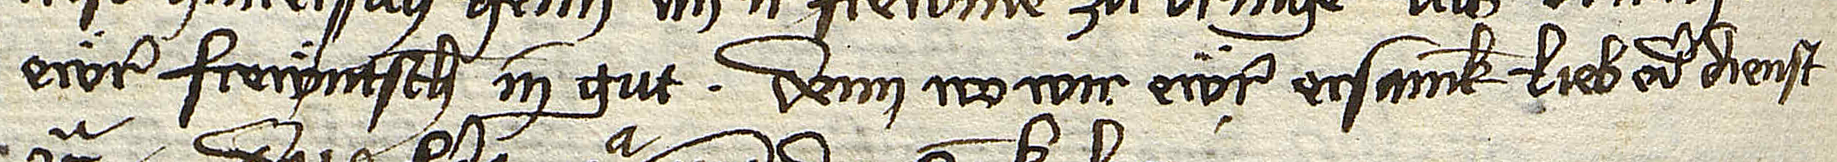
ewr frewntſch* in gut . Denn wo wir ewr* erſamk* . lieb od* dienſt
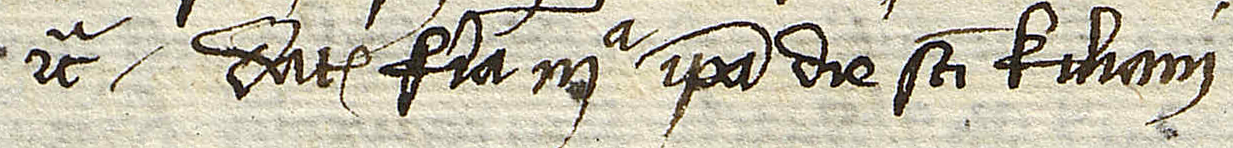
ec* / Dat* fi*a iii* ipa* die ſci* Kiliani
